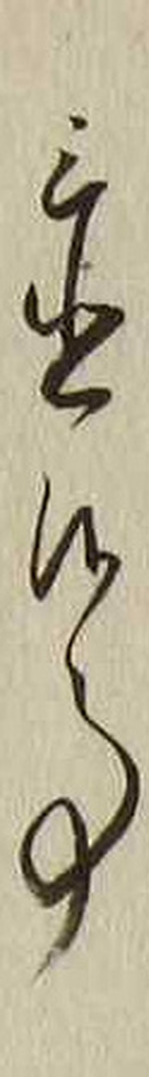置候事
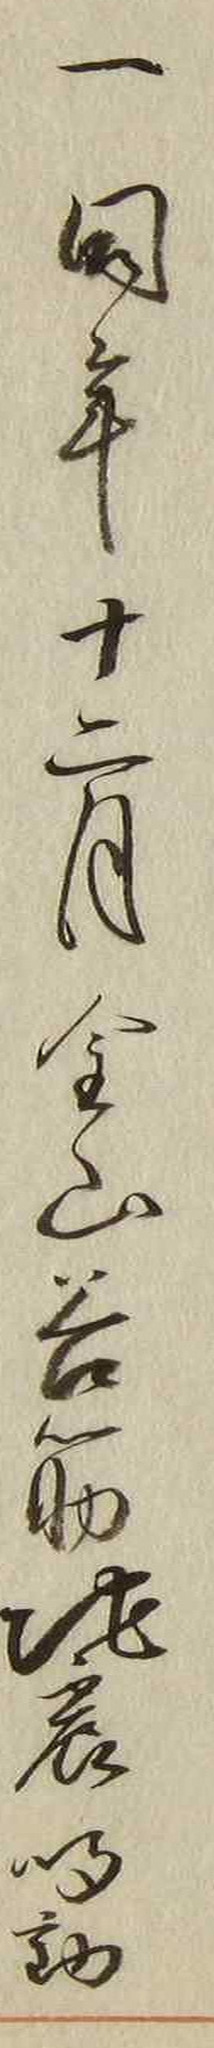一同年十二月金山谷筋地震鳴動
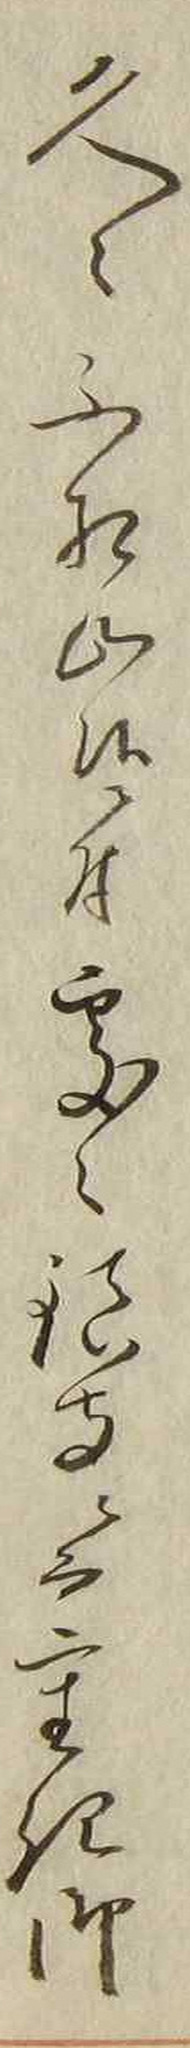久々不相止候ニ付處々鎮守ニ而重紀御
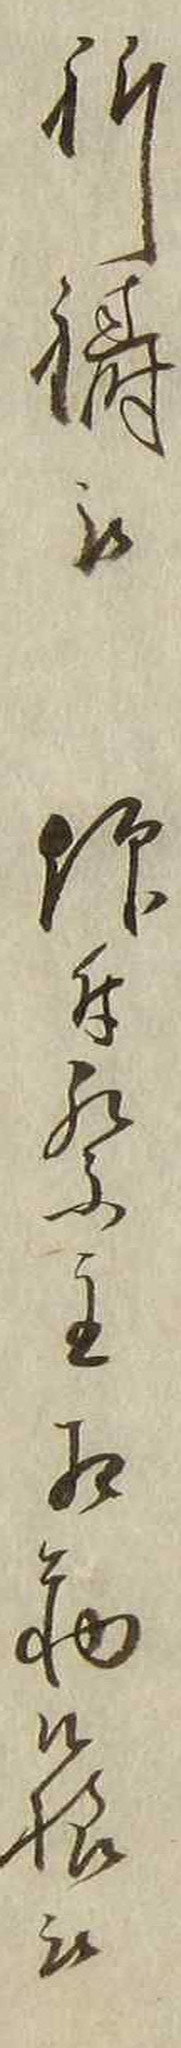祈禱被仰付祭主相勤候様被
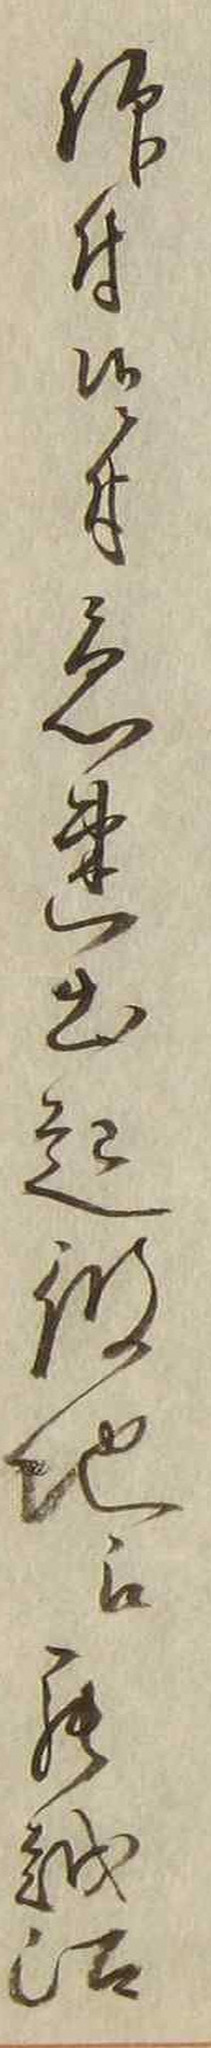仰付候ニ付急速出起彼地江罷越御

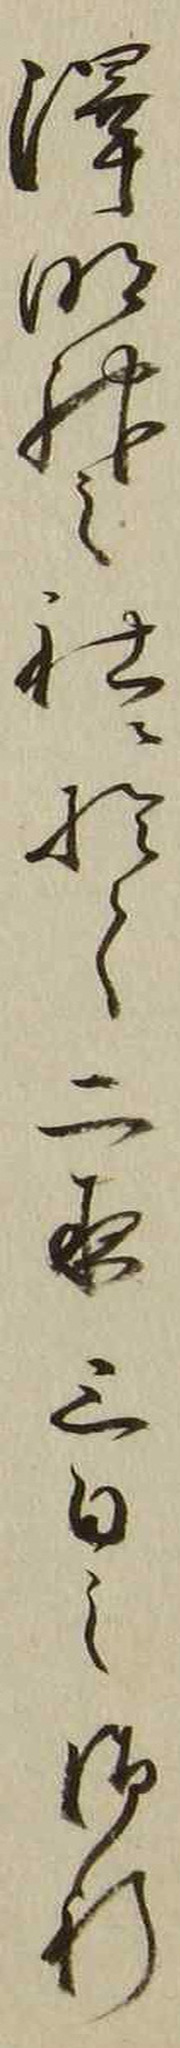澤明神之社ニ於て二夜三日之御祈
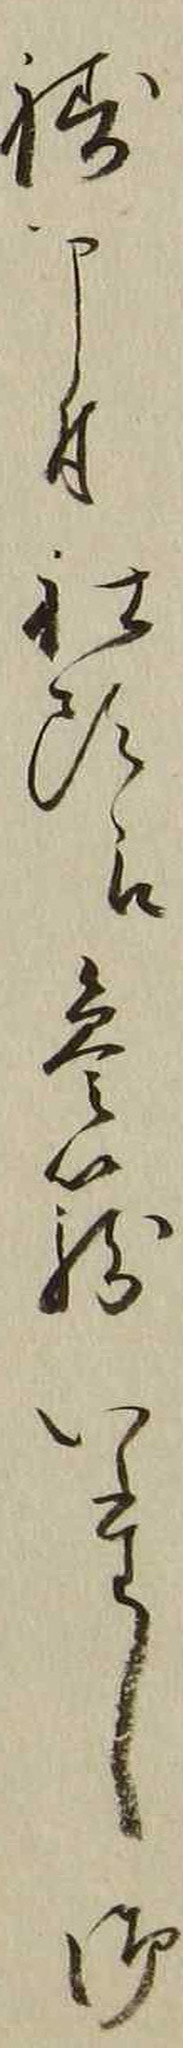禱申付社頭江参籠いたし御
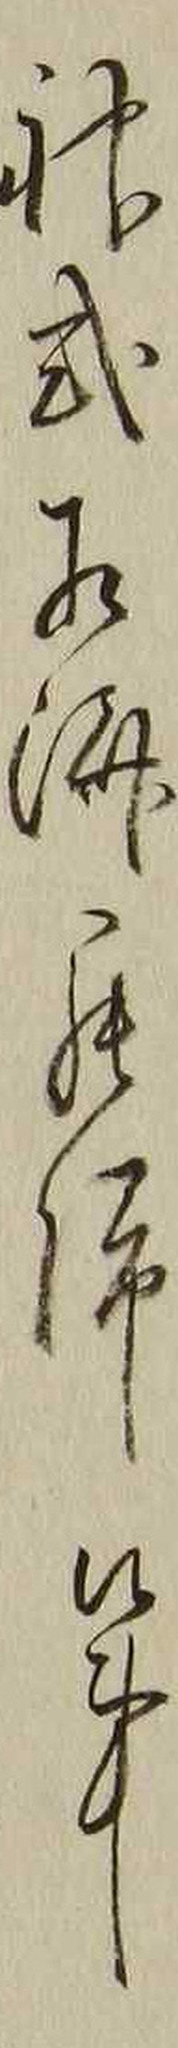神式相済罷帰候事
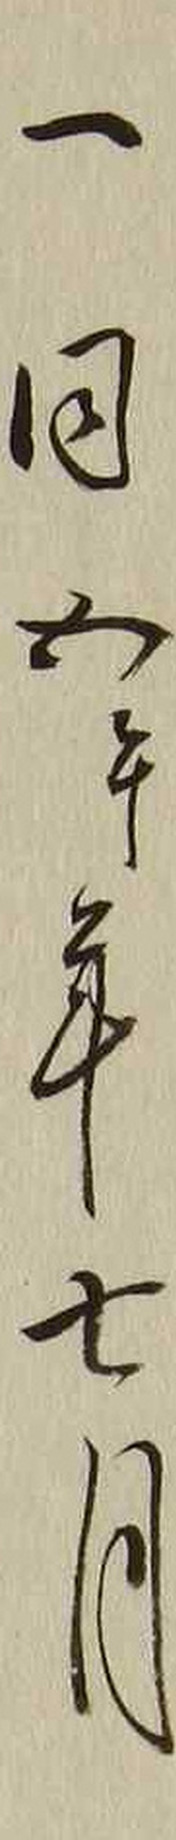一同五午年七月
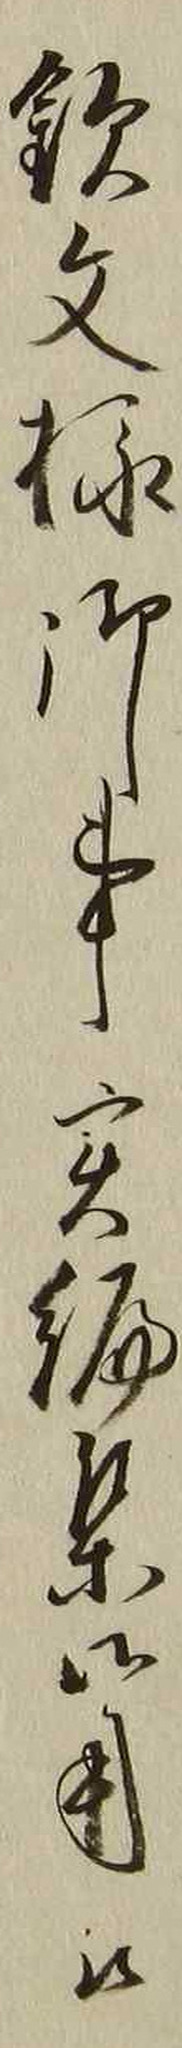欽文様御事実編集御用被
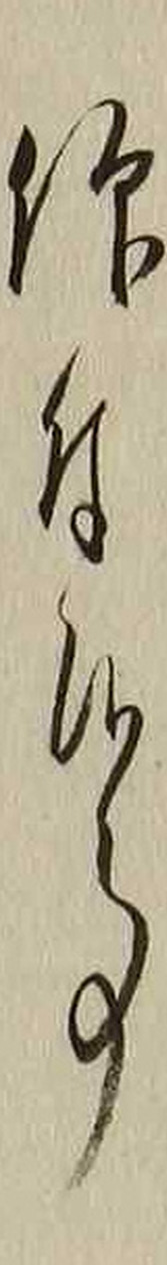仰付候事
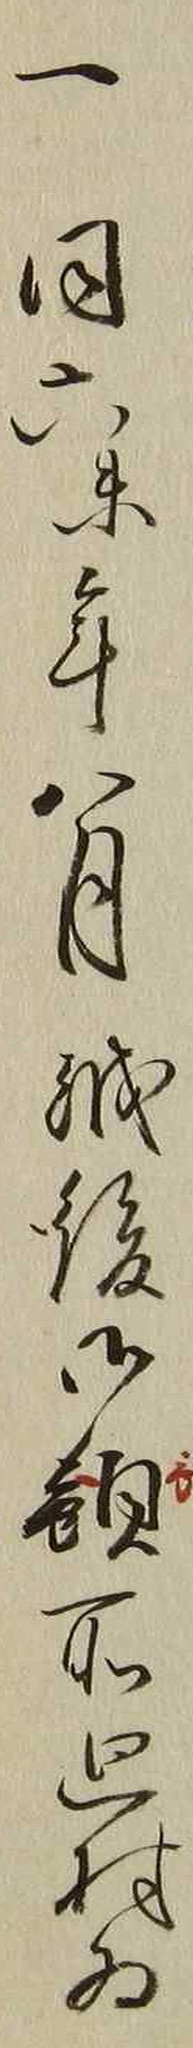一同六未年八月越後御領所廻村為
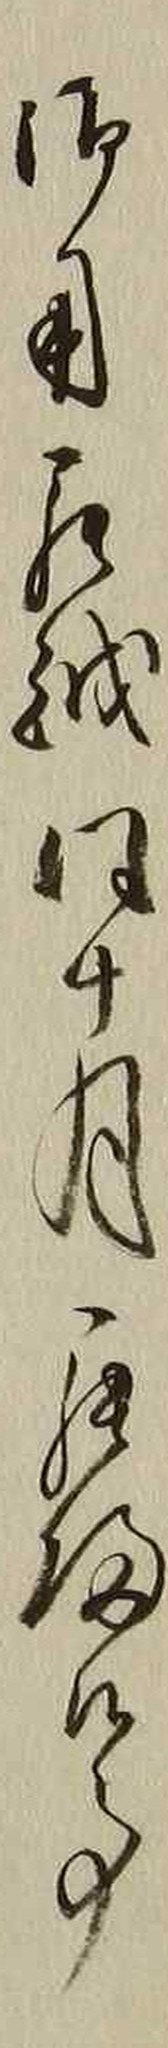御用罷越同十月罷帰候事
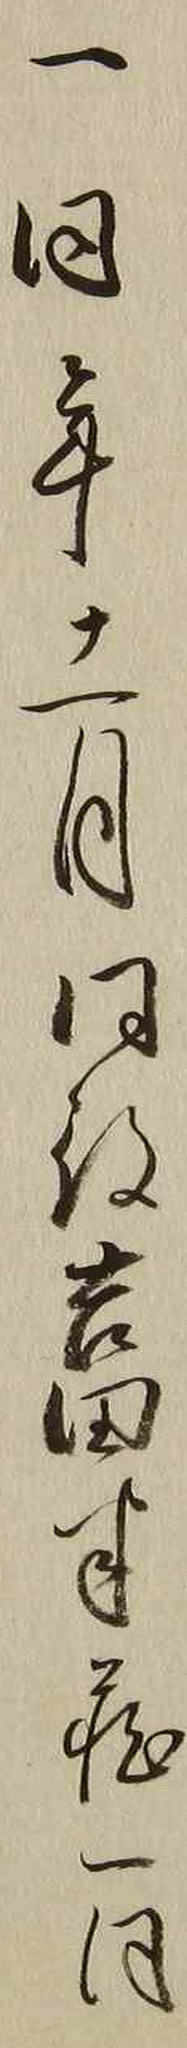一同年十一月同役吉田半蔵一同
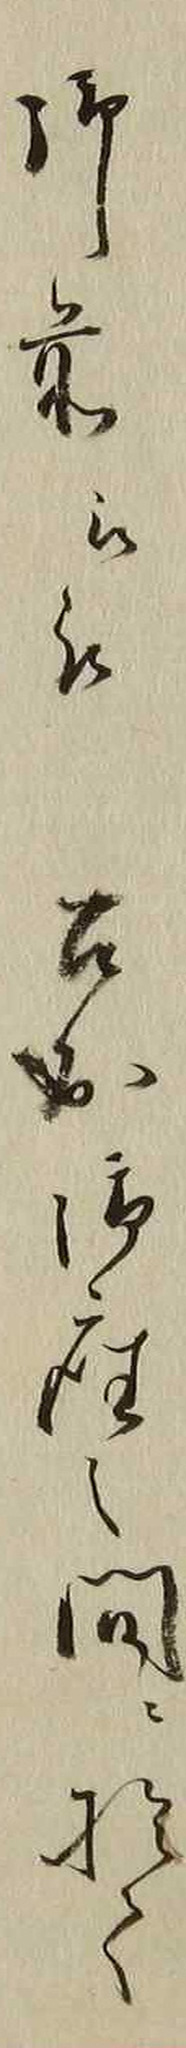御前江被召出御座之間ニ於て
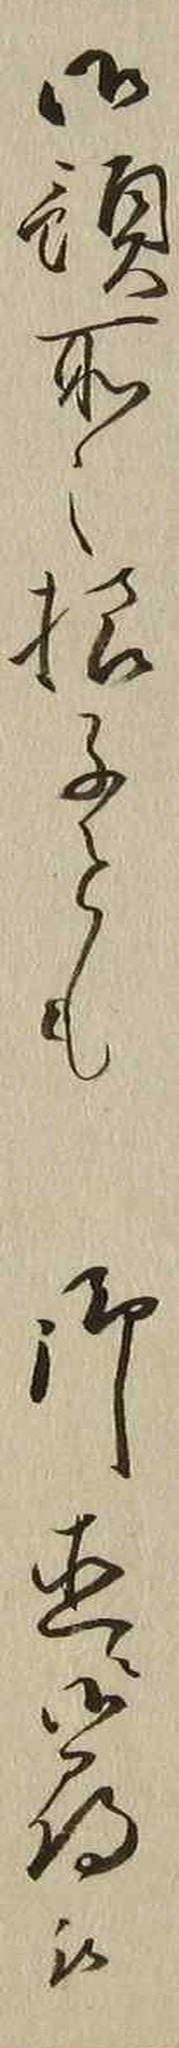御領所之様子とも御直ニ御尋被
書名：諸士系譜　巻之68　を之部2
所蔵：会津若松市立会津図書館
